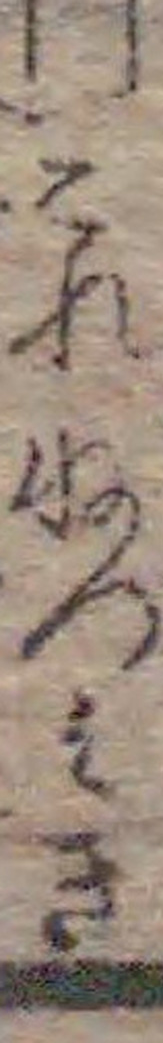これねづみき
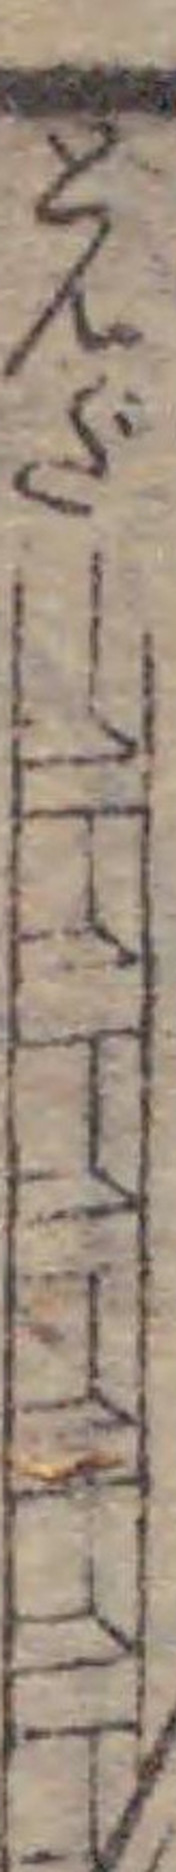とんだ
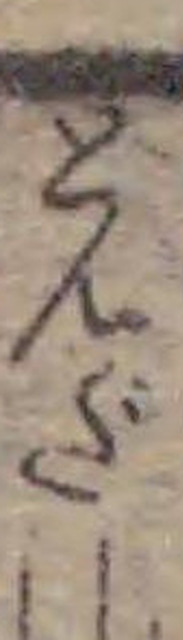とんだ
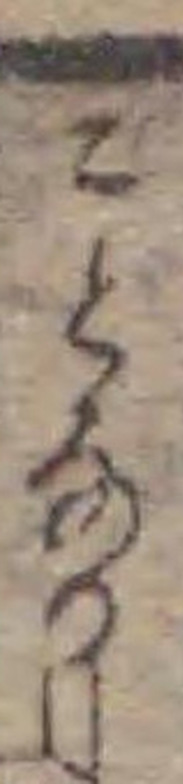ことなり
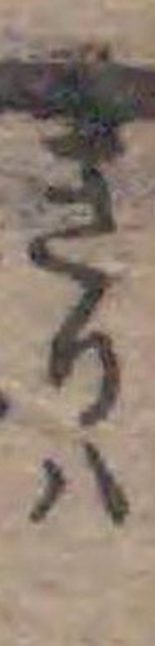きりは
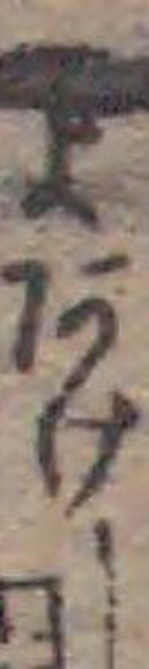よあけ
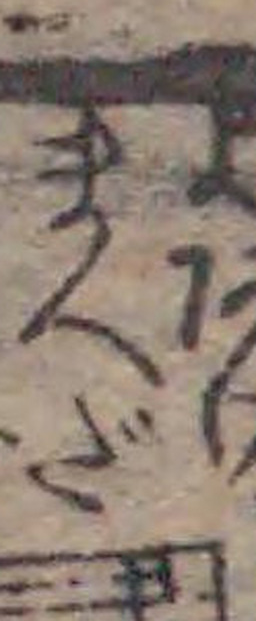まへだ
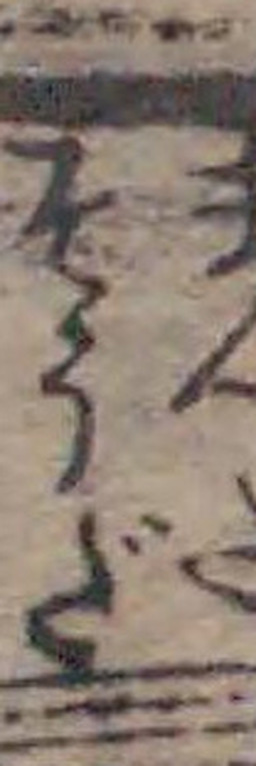そうだ
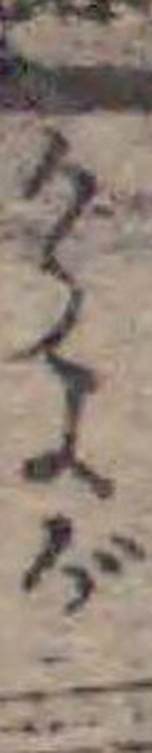からよが
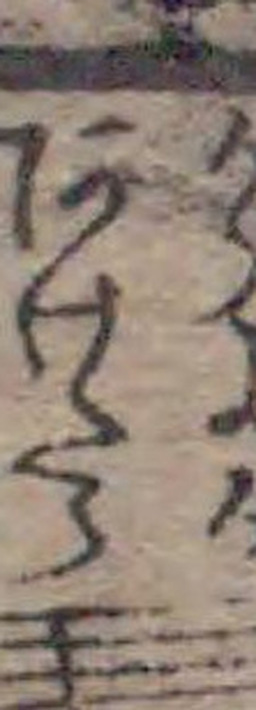あけたら
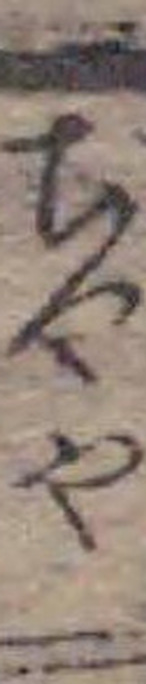ちやや
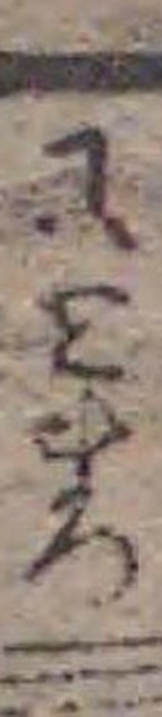にとまつ

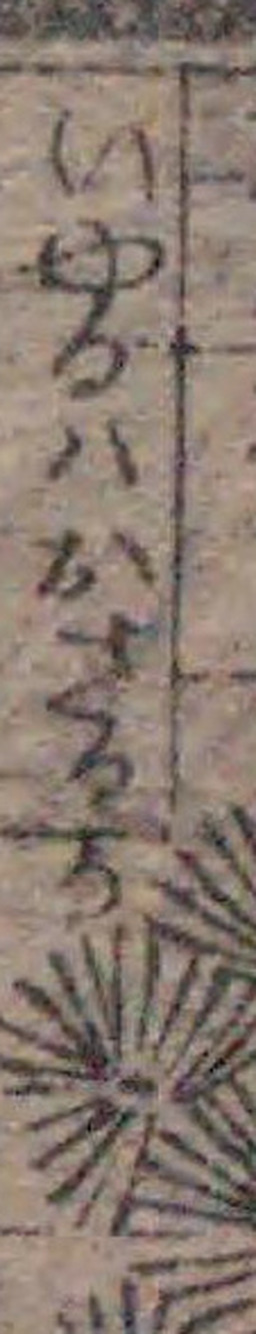いやるはおさるか
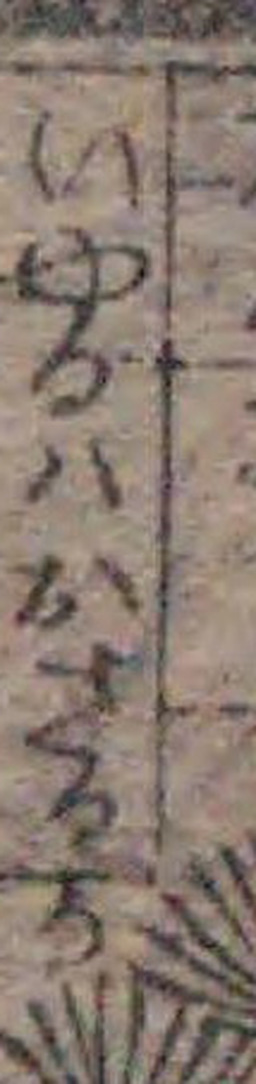いやるはおさるか
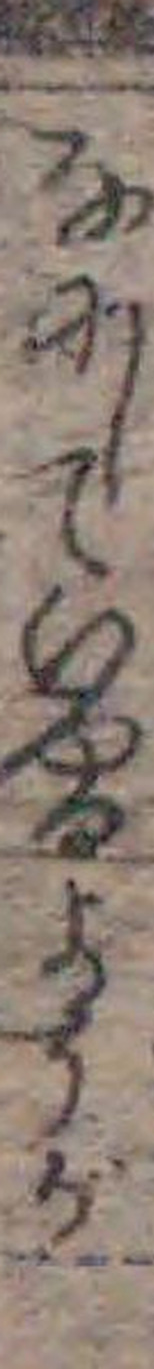なにしていやるようか
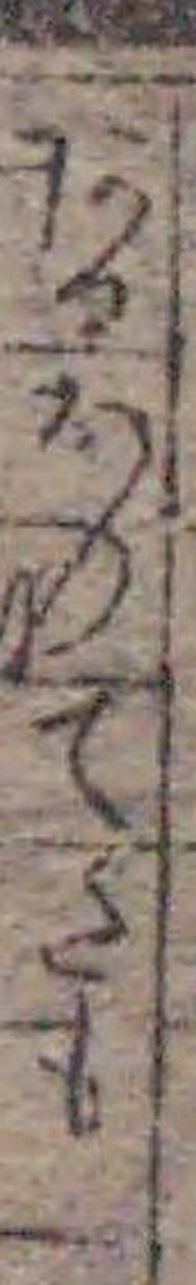あるおりてたも
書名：化物七段目 : 2巻
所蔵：国立国会図書館 National Diet Library, JAPAN
